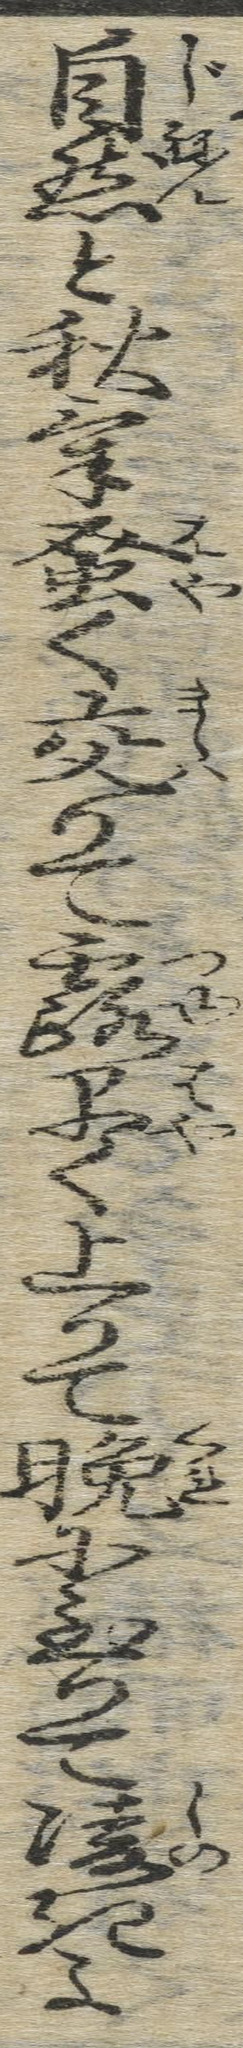自然と秋気蚤く交りて露早く上りて晩に至りて凌きよ
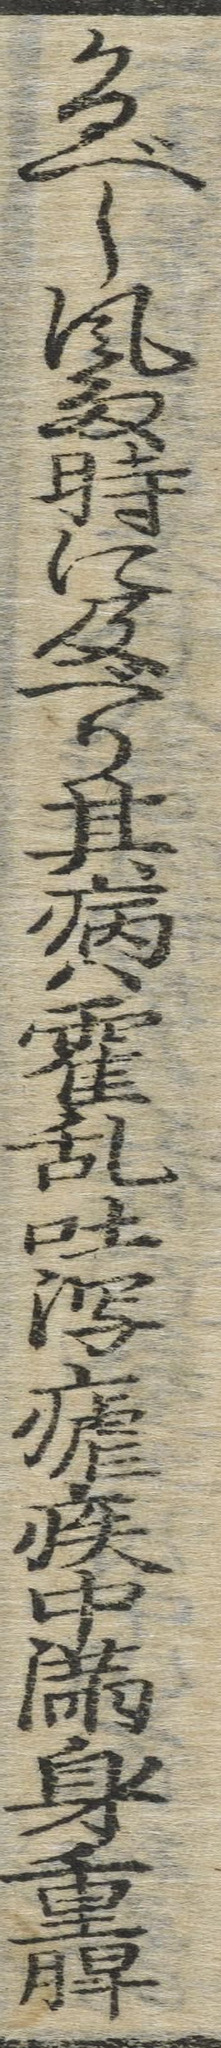かるべし風多時に及べり其病は霍乱吐瀉瘧疾中満身重脾
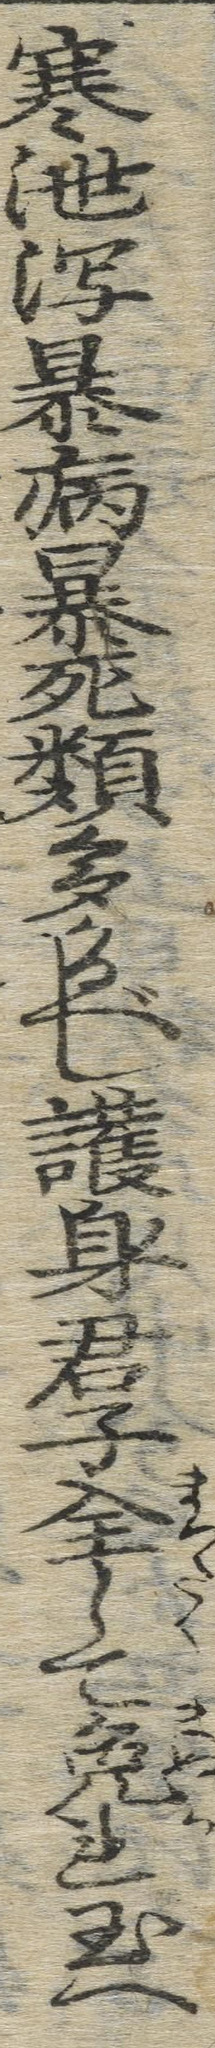寒泄瀉暴病暴死類多かるべし護身君子全して免れ玉へ
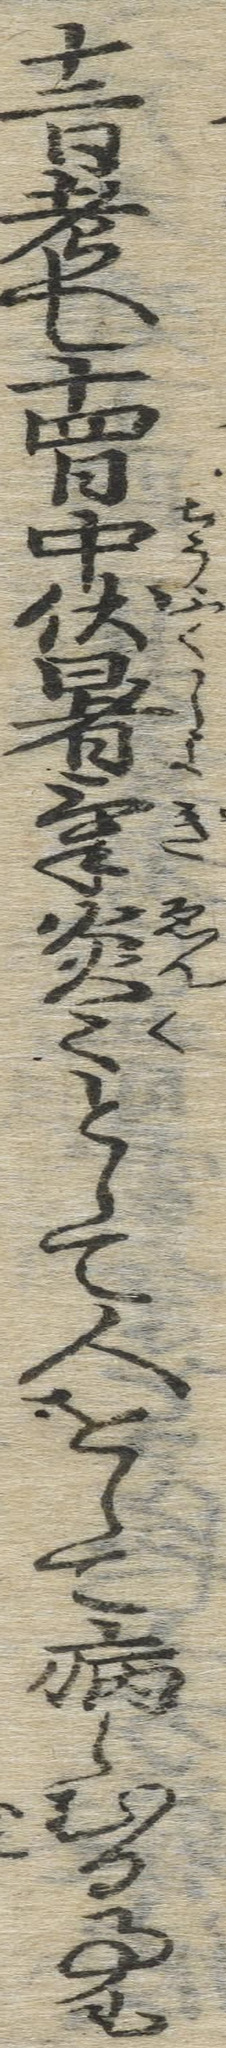十二日考へし十四日中伏暑気炎々として人をして病しむる事も
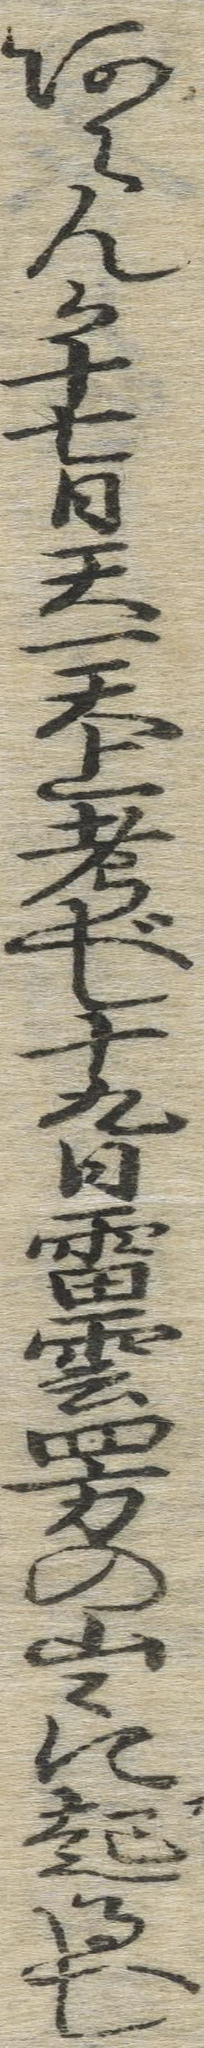あらんか十七日天一天上考べし十九日雷雲四方の山々に起るへし
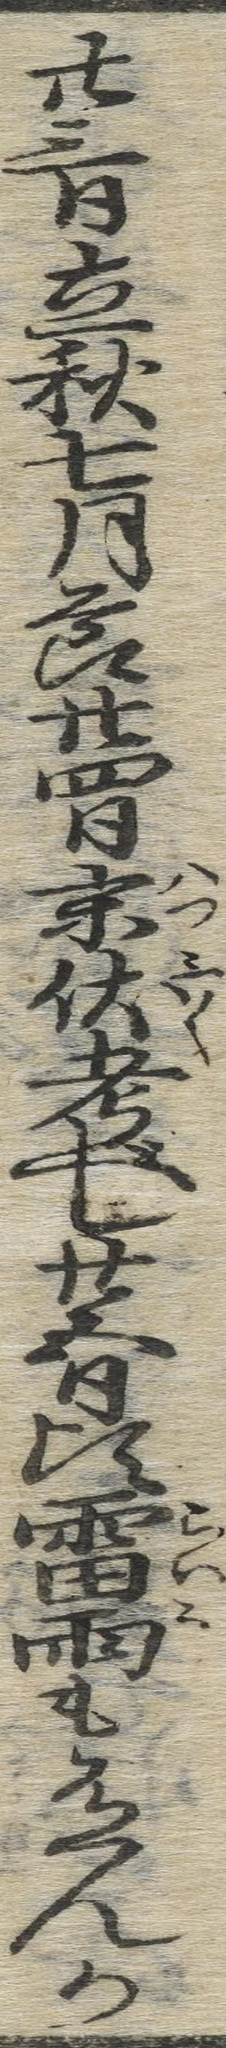廿三日立秋七月節廿四日京伏考べし廿五日頃雷雨も有んか
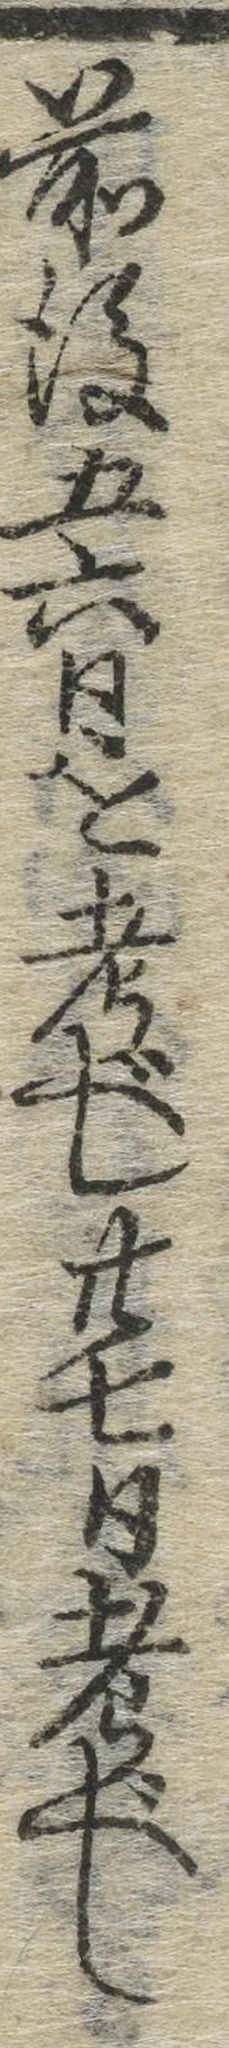前後五六日を考べし廿七日考べし
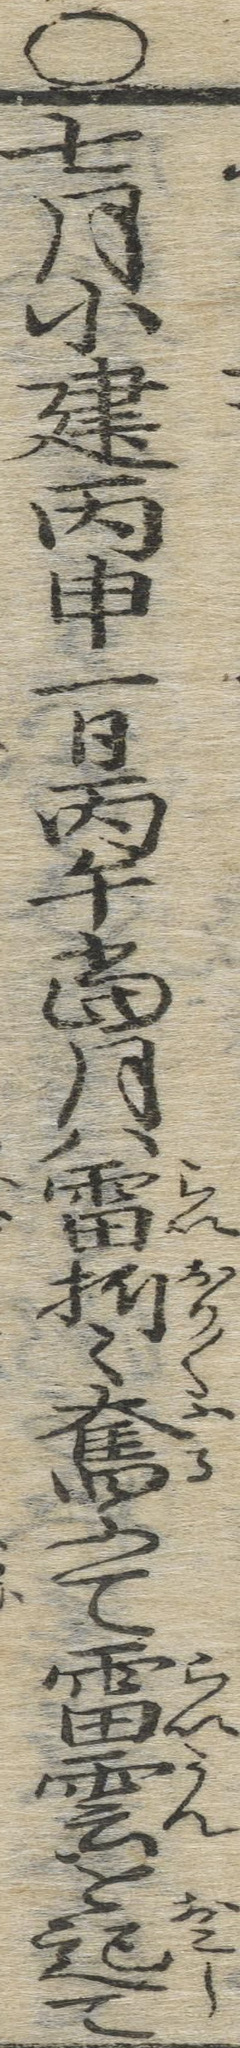七月小建丙申一日丙午当月は雷折々奮ふて雷雲を起て
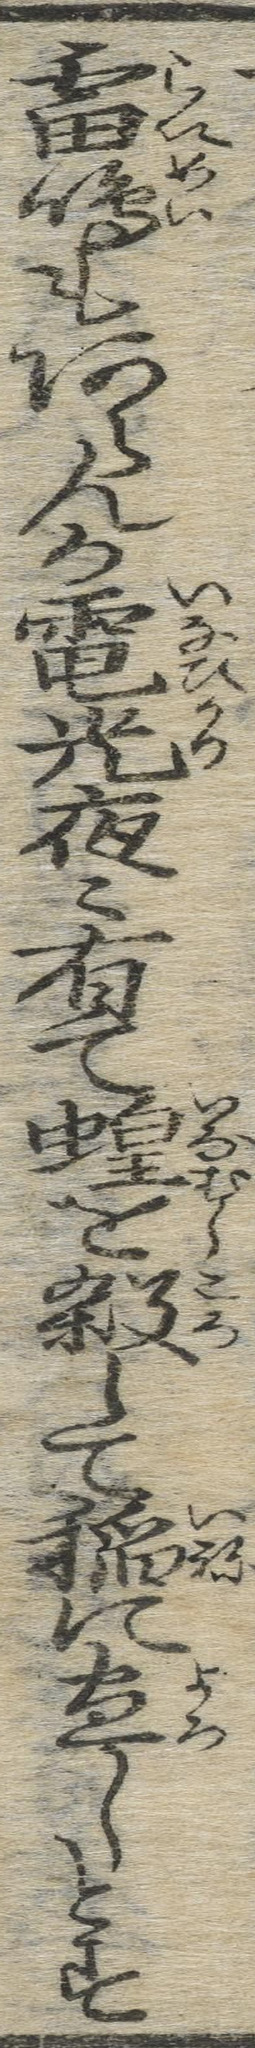雷鳴もあらんか電光夜々有て蝗を殺して稲に宜しとす
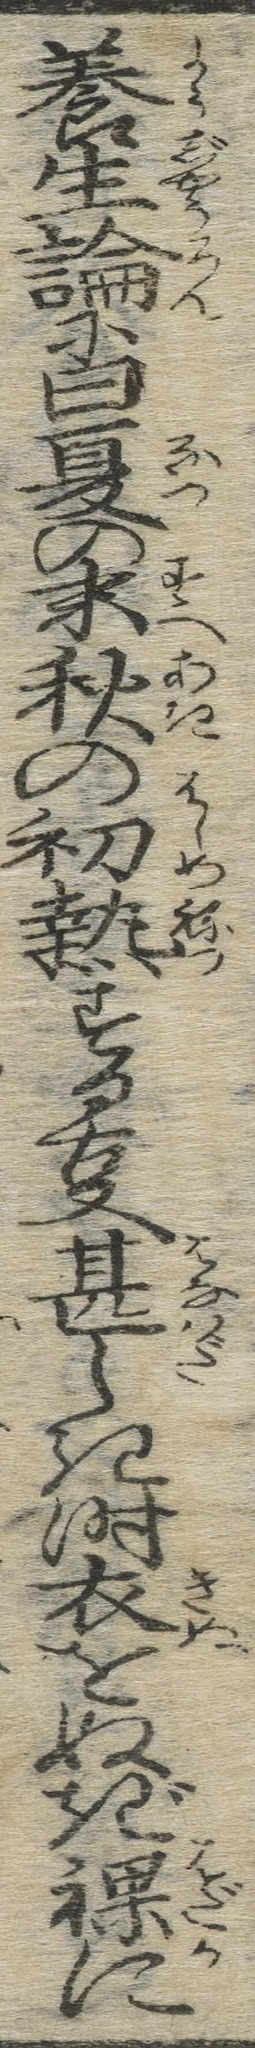養生論に曰夏の末秋の初熱する事甚しき時衣をぬぎ裸に
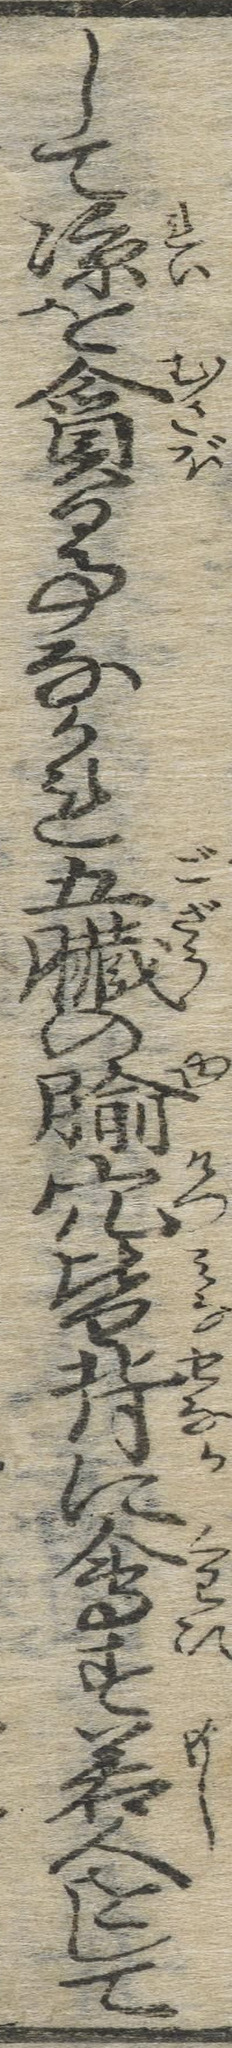して凉を貪る事なかれ五臓の腧穴皆背に会す若人をして
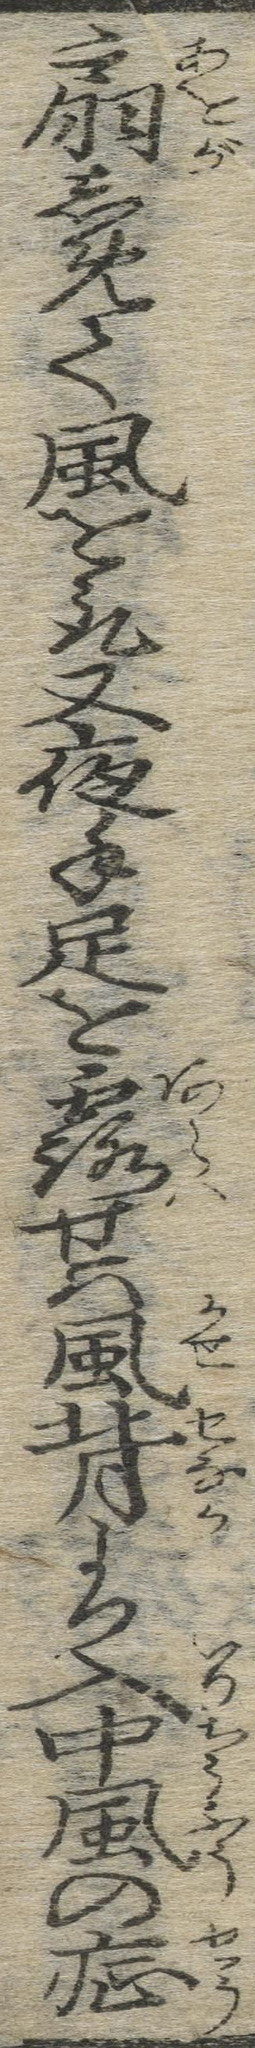扇しめて風を取又夜手足を露せは風背中より入中風の症

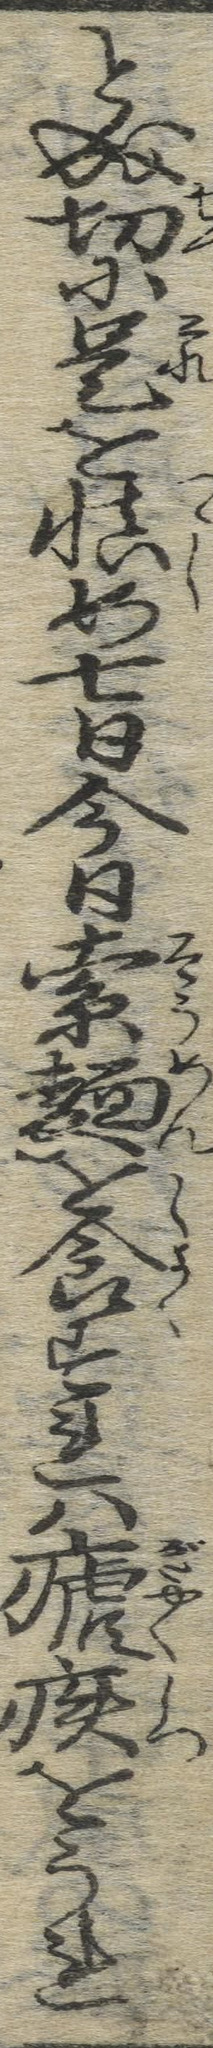と成切に是を慎め七日今日素麺を食すれは瘧疾をうれ
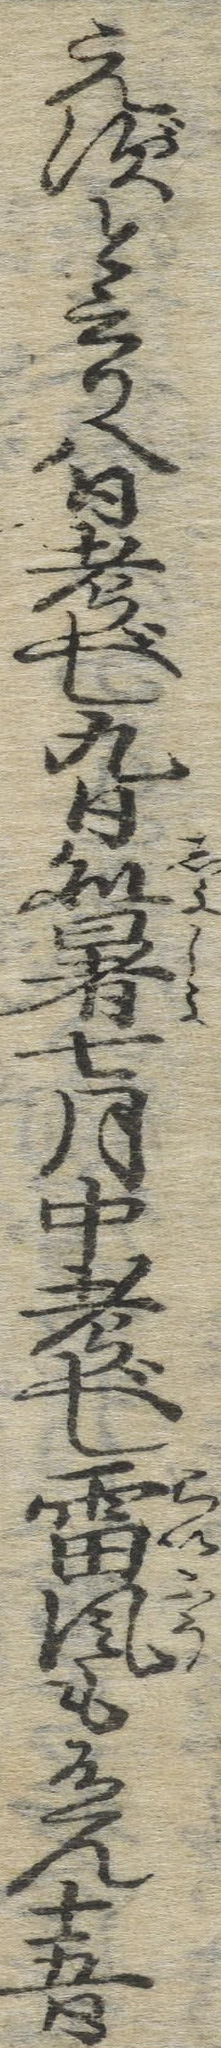えずと云り八日考べし九日処暑七月中考べし雷風も有ん十五日
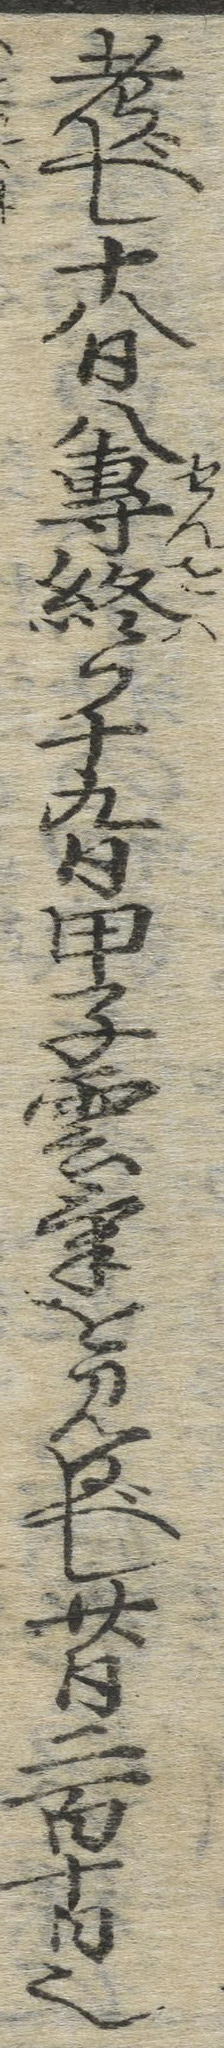考べし十八日八専終り十九日甲子雲気を見るべし廿日二百十日也
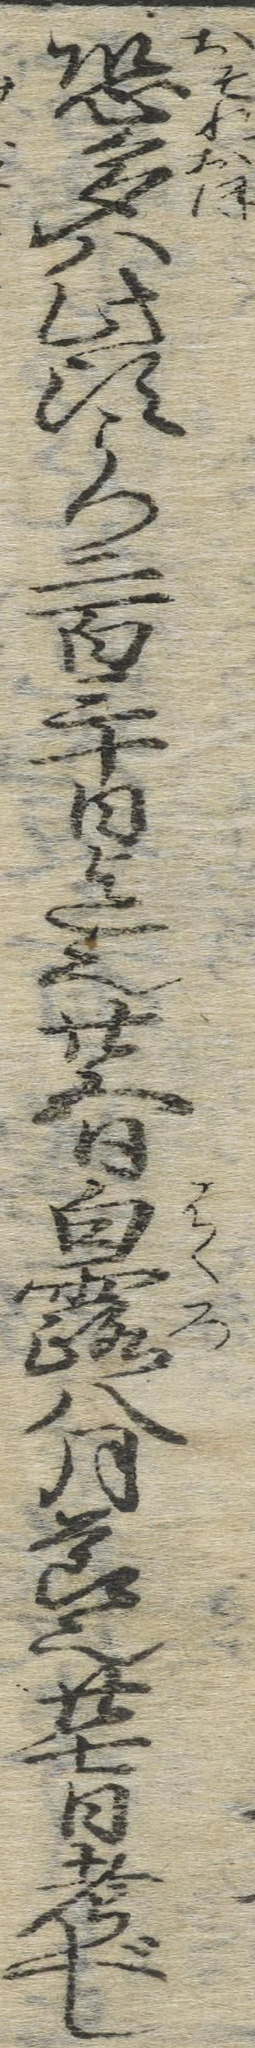恐多は此頃より二百二十日迄也廿六日白露八月節也廿七日考べし
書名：[晴雨考]
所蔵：東京大学地震研究所図書室 Earthquake Research Institute Library, The University of Tokyo, JAPAN
